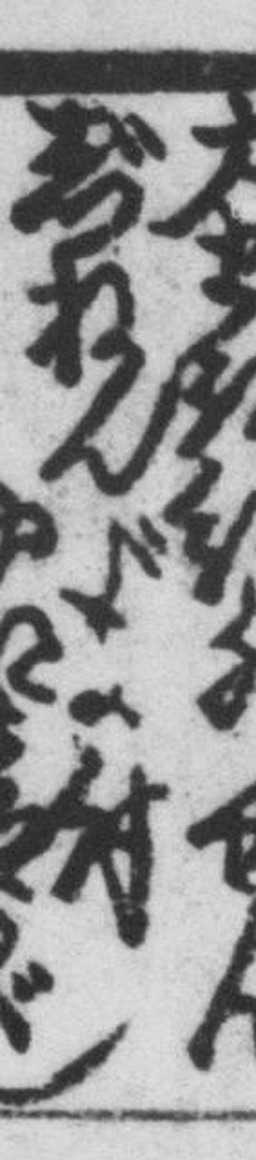じねんじよ付
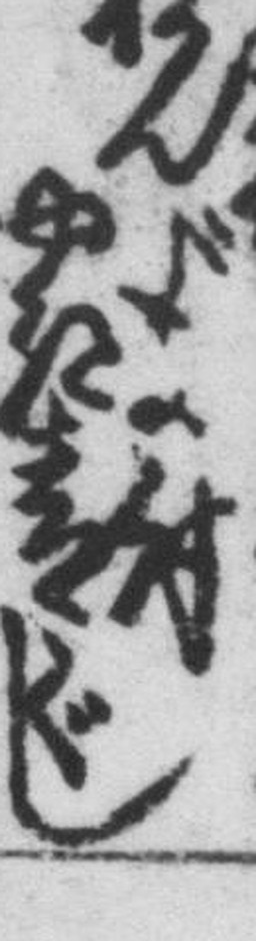やき青くじ
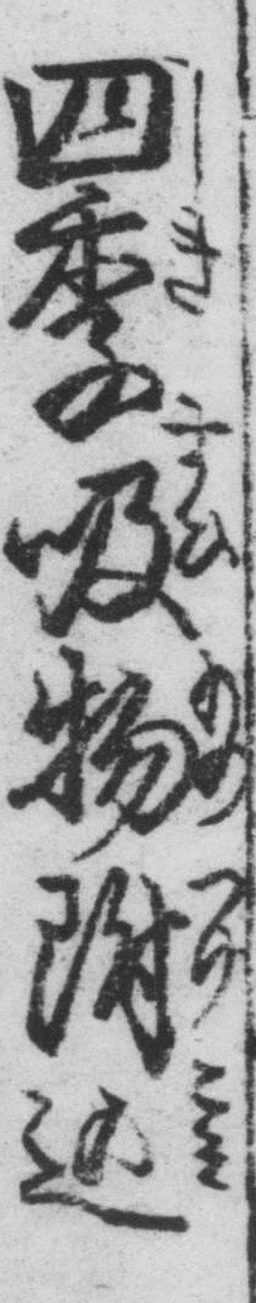四季吸物附込
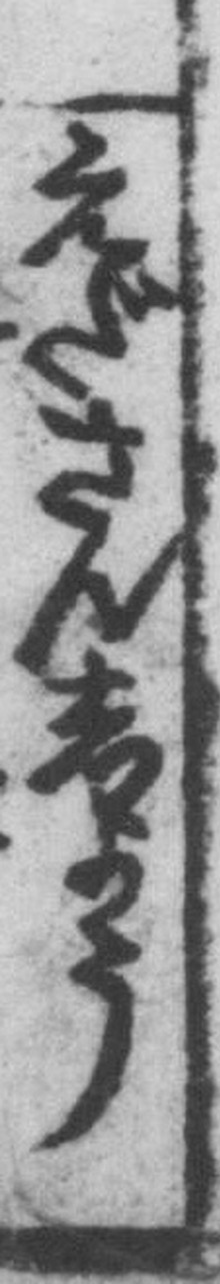こさんしよう
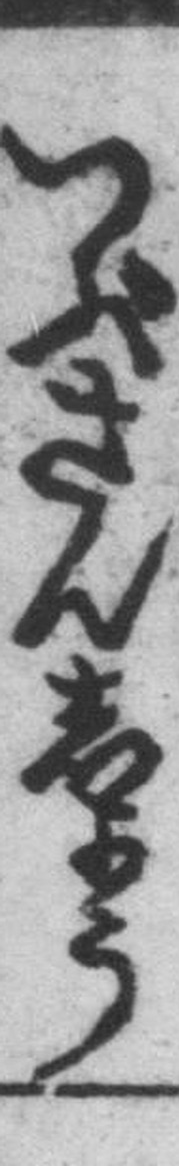こさんしよう
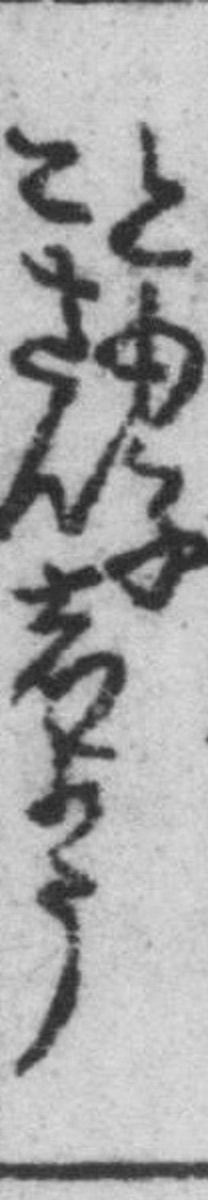こさんしよう

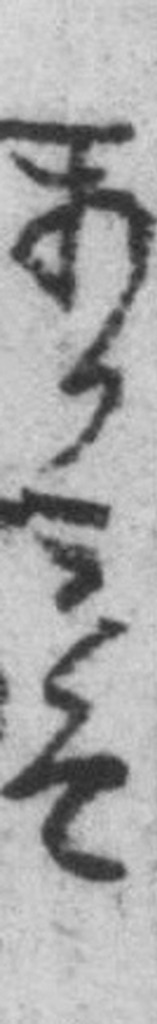あかミそ
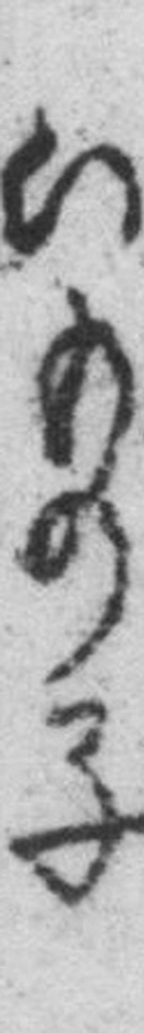いもの子
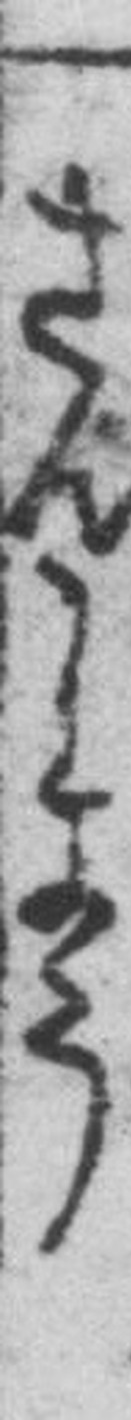さんしよう
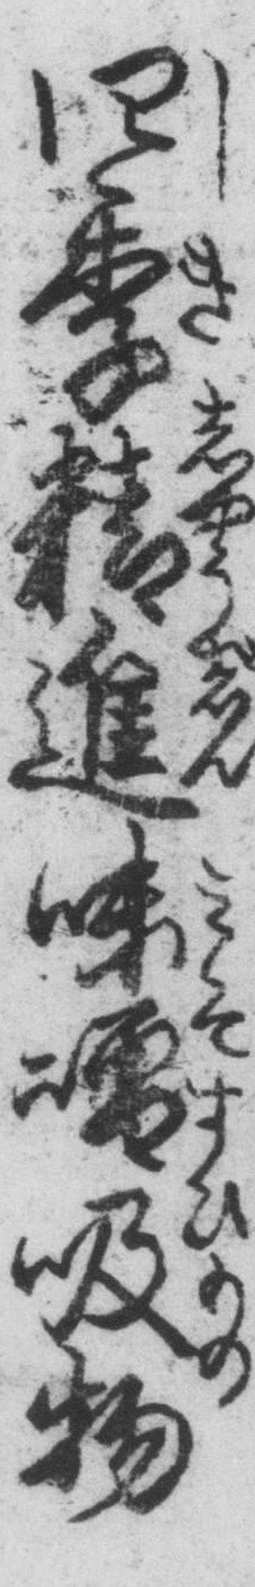四季精進味噌吸物
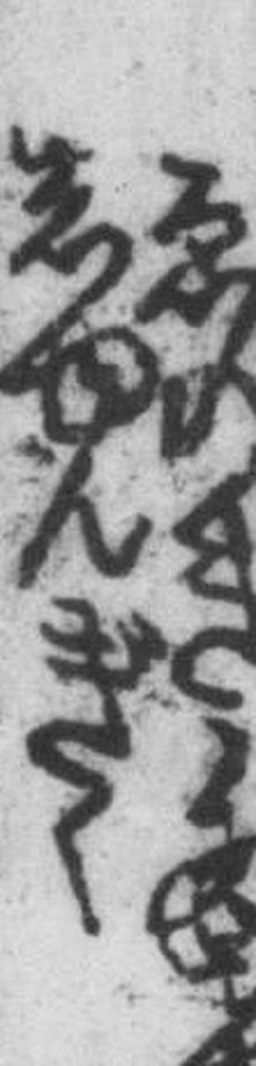しゆんぎく
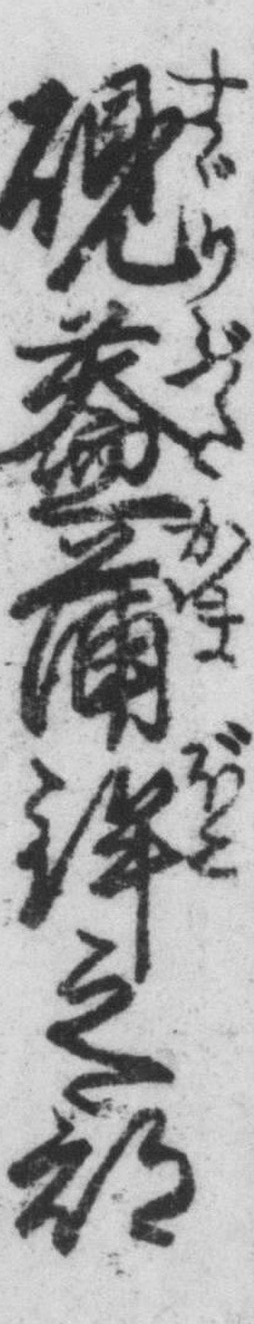硯蓋蒲鉾之部
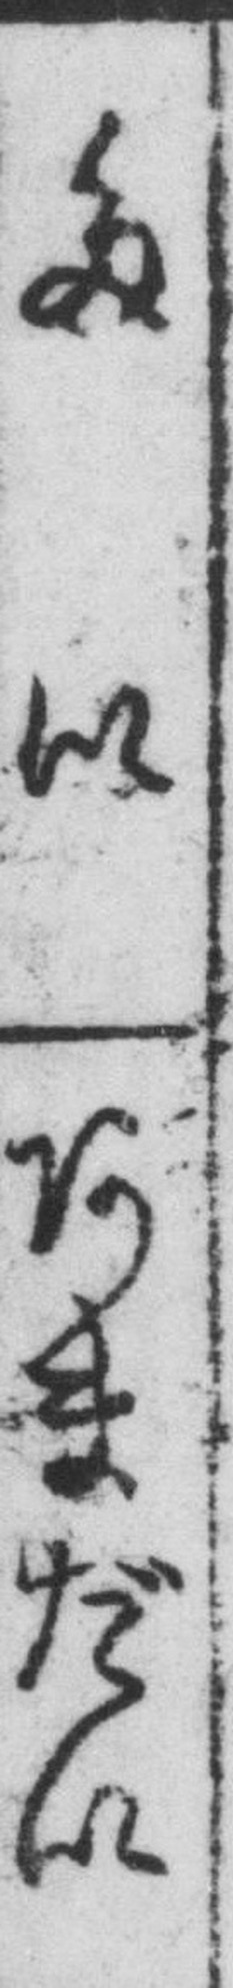たいあまだい
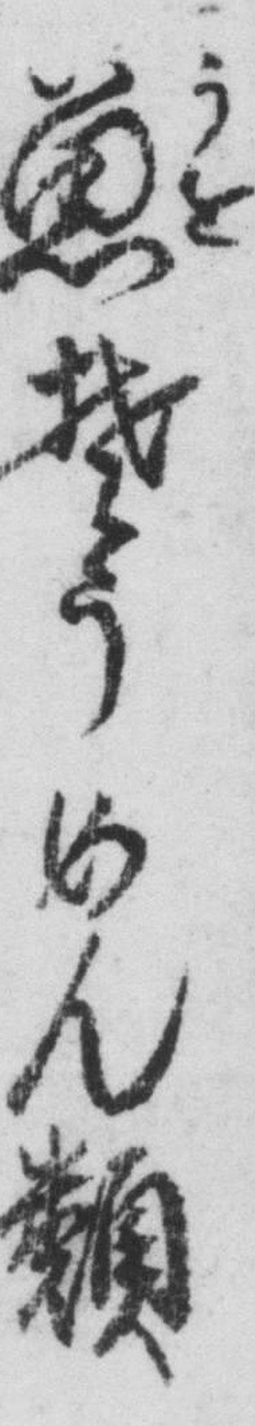魚そうめん類
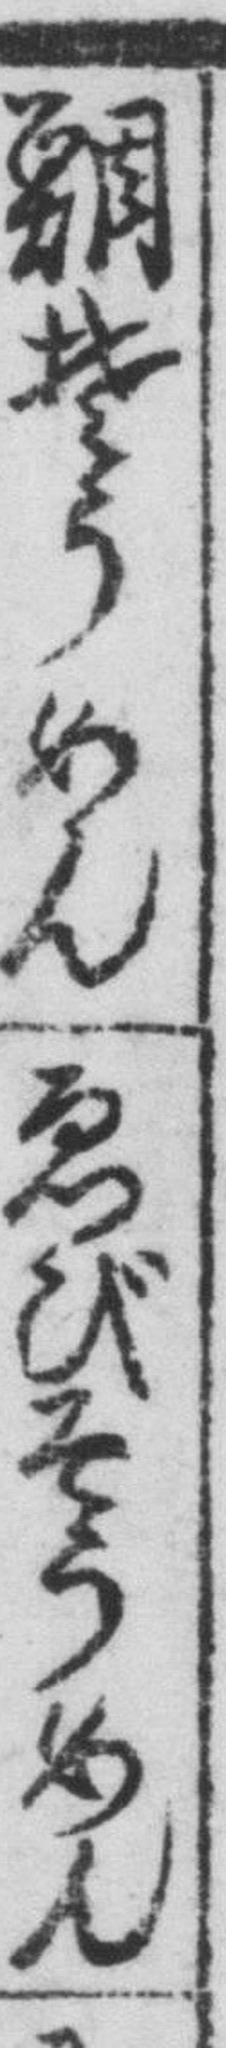鯛そうめんゑびそうめん
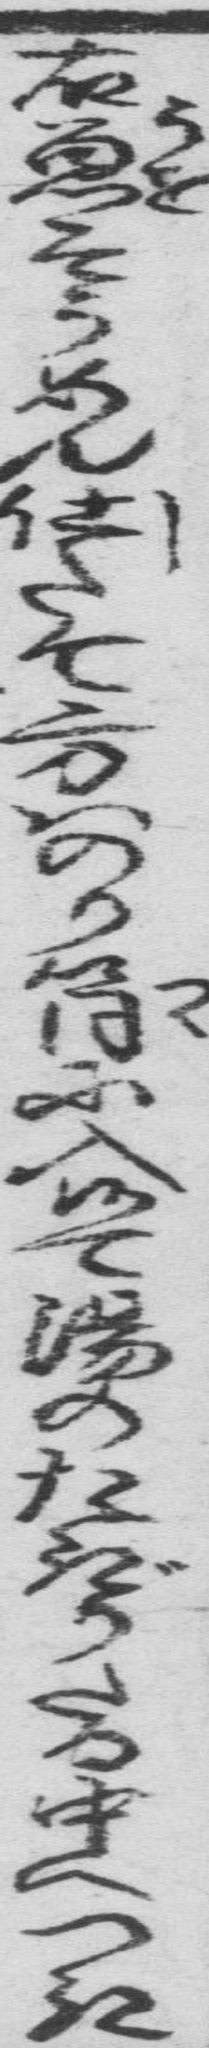右魚そうめん仕たて方ハのりに入れて湯のたぎりたる中へつき
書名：即席庖丁
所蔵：大阪府立大学学術情報センター 国文学研究資料館
